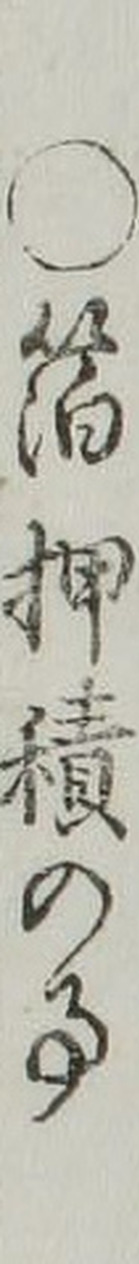○箔押積の事
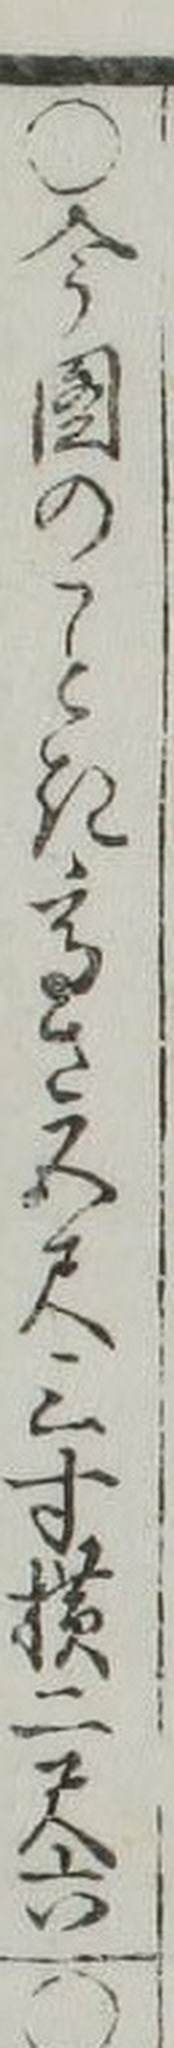○今図のことき高さ五尺三寸横二尺六
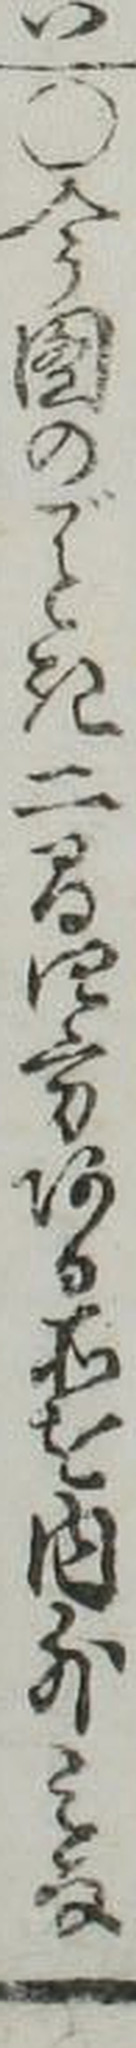○今図のごとき二間四方ある所を内外みな
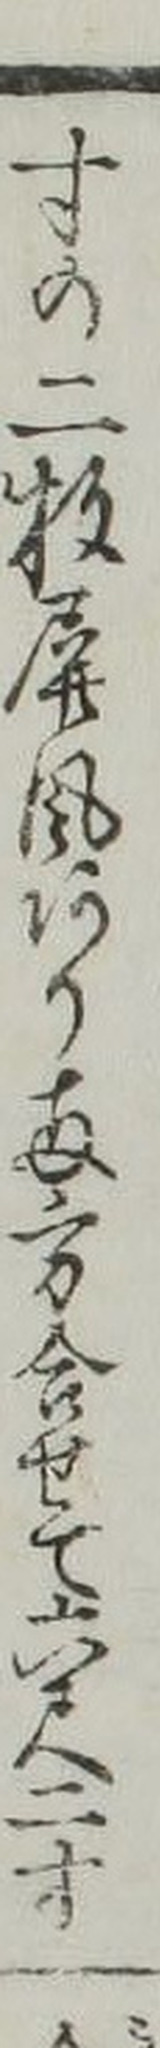寸の二枚屏風あり両方合せて六尺二寸
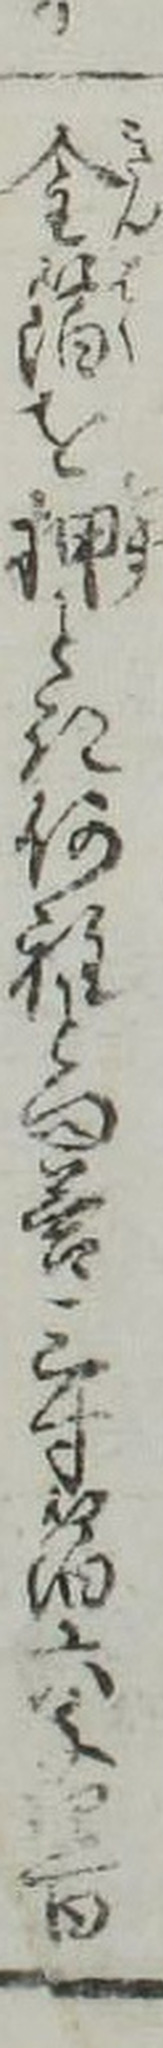金箔を押とき何程と問答三寸箔六千四百
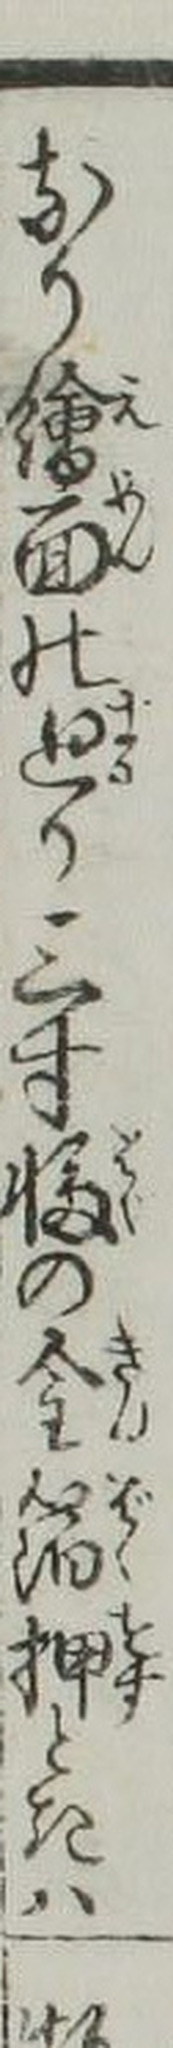なり絵面の廻り三寸幅の金箔押ときは
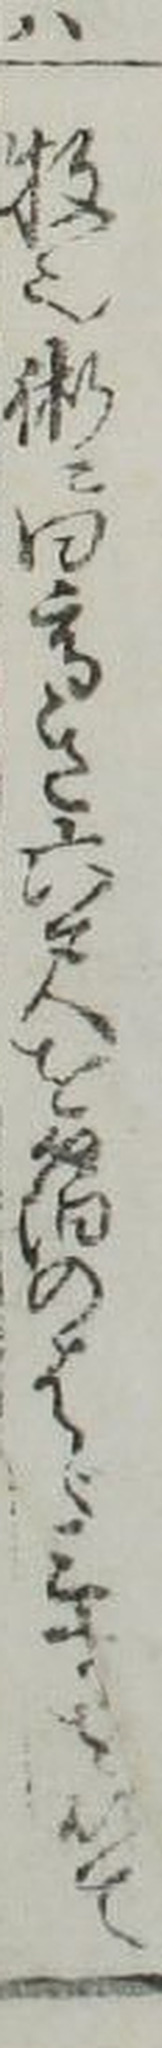枚也術に曰高さ六尺を箔のはゞ三寸を以て

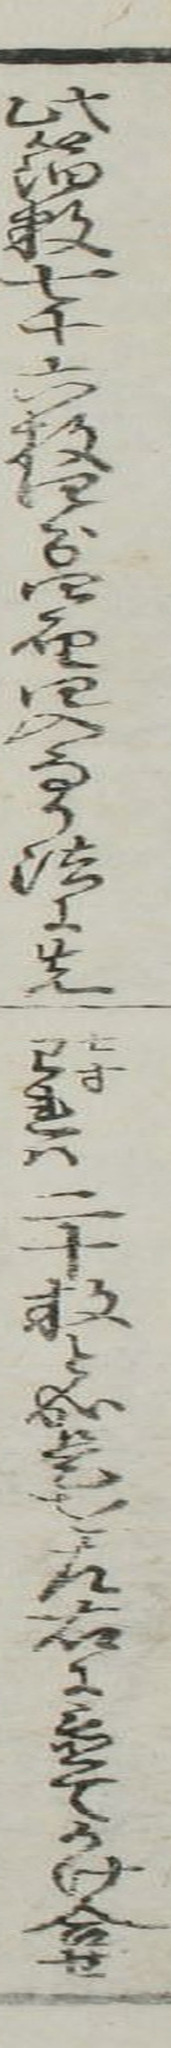此箔数七十六枚四分四厘四入なり法に先
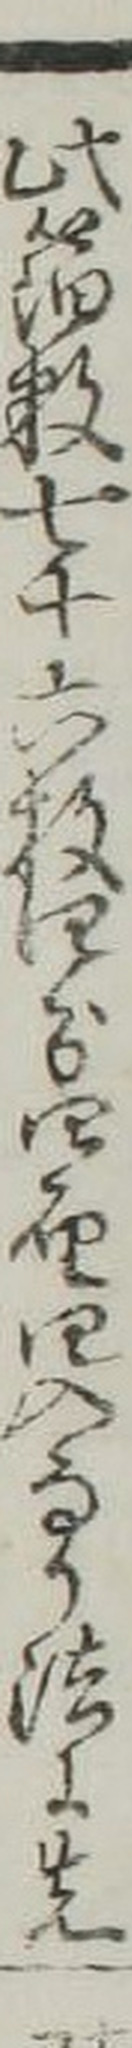此箔数七十六枚四分四厘四入なり法に先
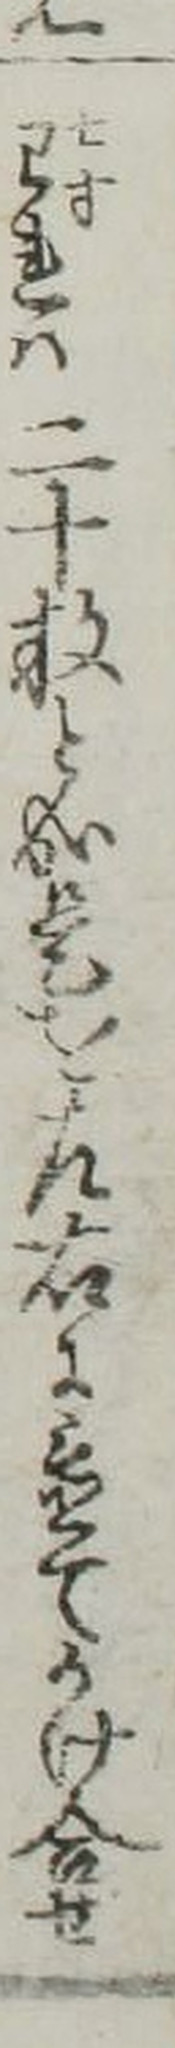われは二十枚と成是を左右に置てかけ合せ
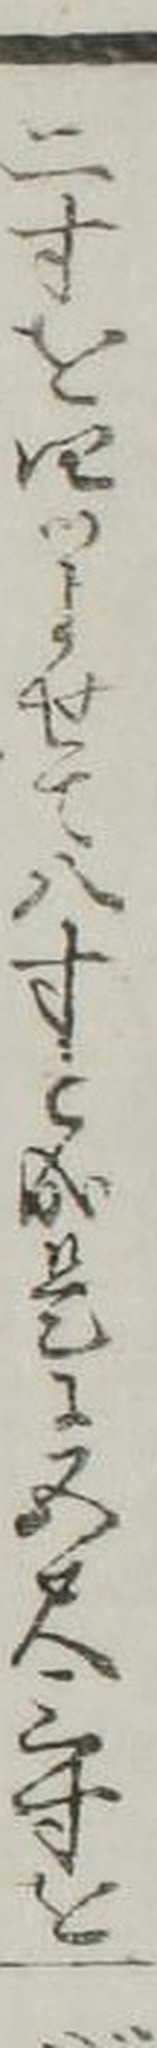二寸を四ツよせて八寸と成是に五尺三寸を
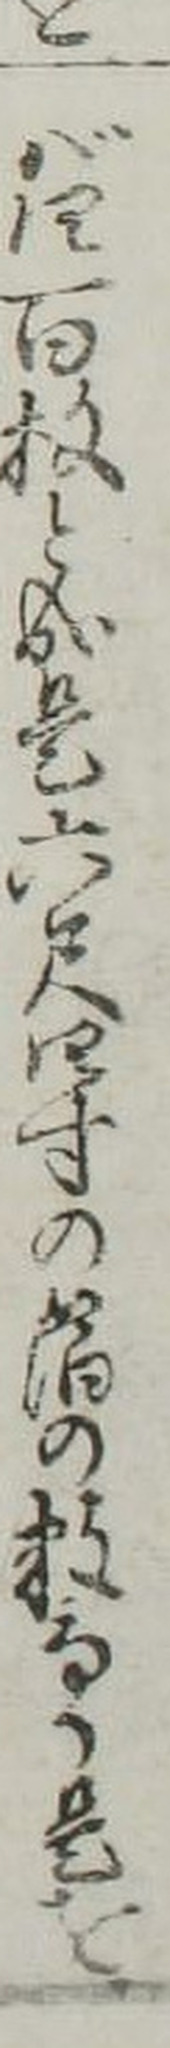ば四百枚と成是六尺四寸の箔の数なり是を
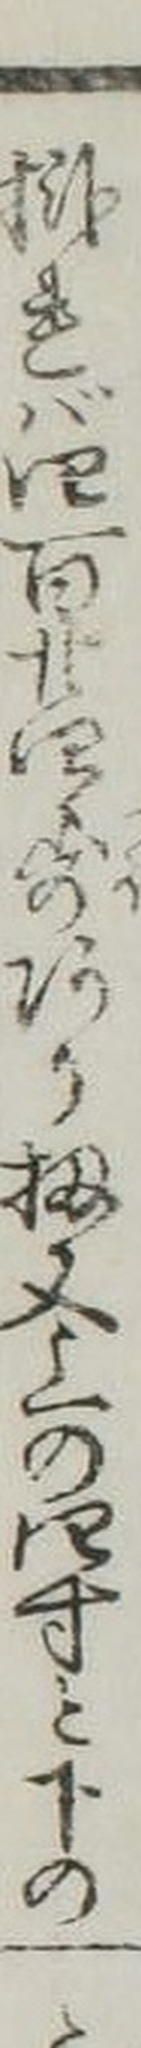掛れば四百廿四歩あり扨又上の四寸と下の
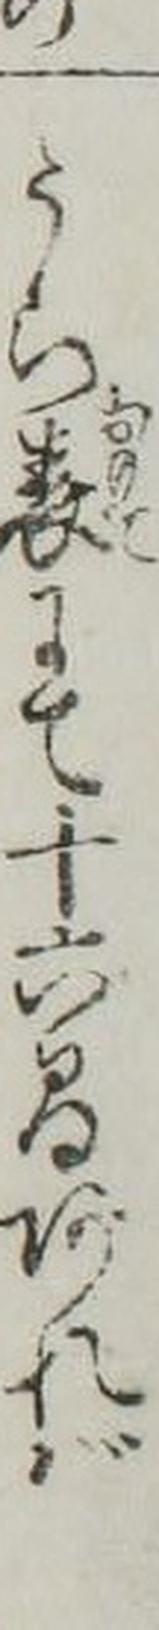うら表にて十六間あれば
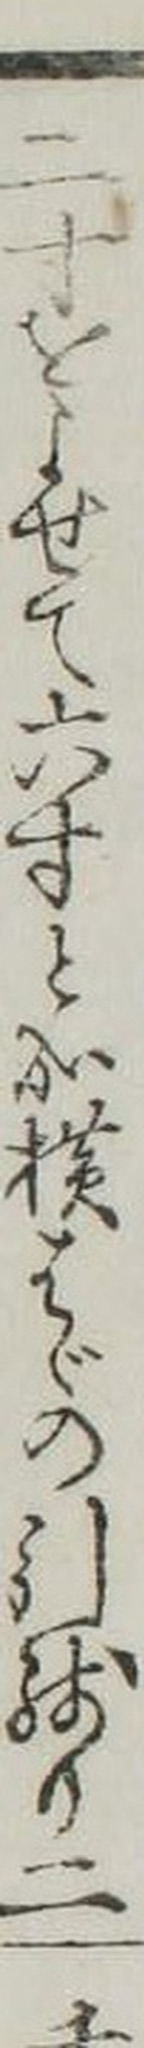二寸をよせて六寸と成横はゞの引残り二
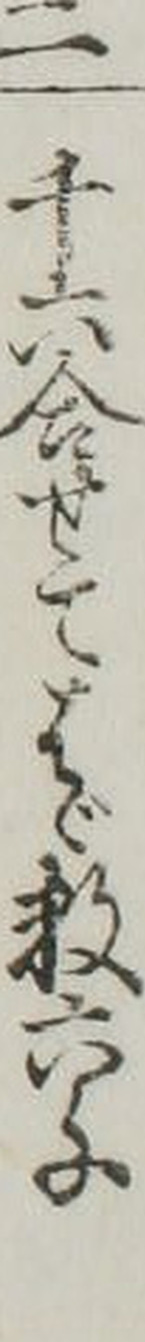千六合せてはゞ数六千
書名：宝玉塵劫記
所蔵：東京学芸大学教育コンテンツアーカイブ
